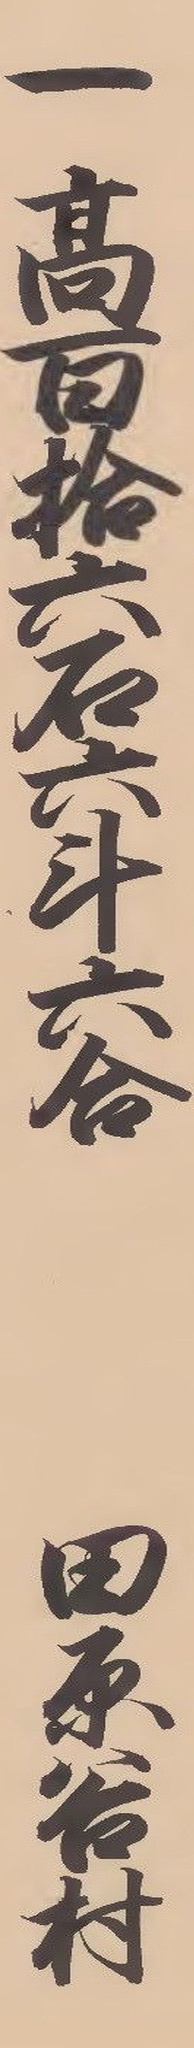一高百拾六石六斗六合田原谷村
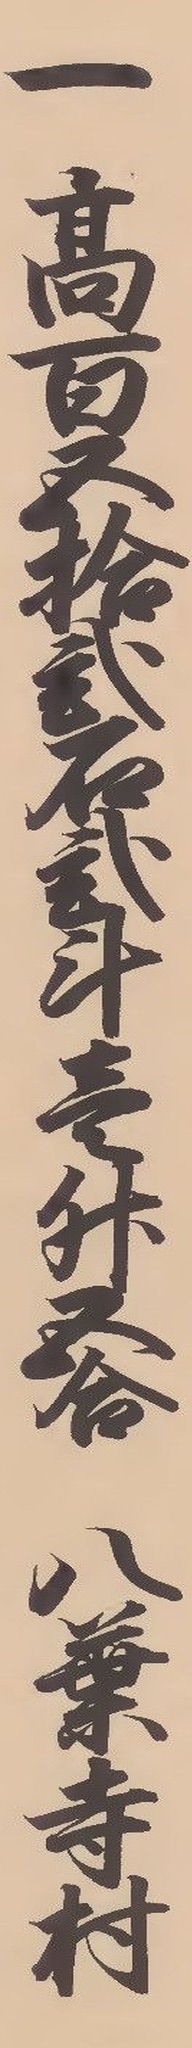一高百五拾弐石弐斗壱升五合八葉寺村
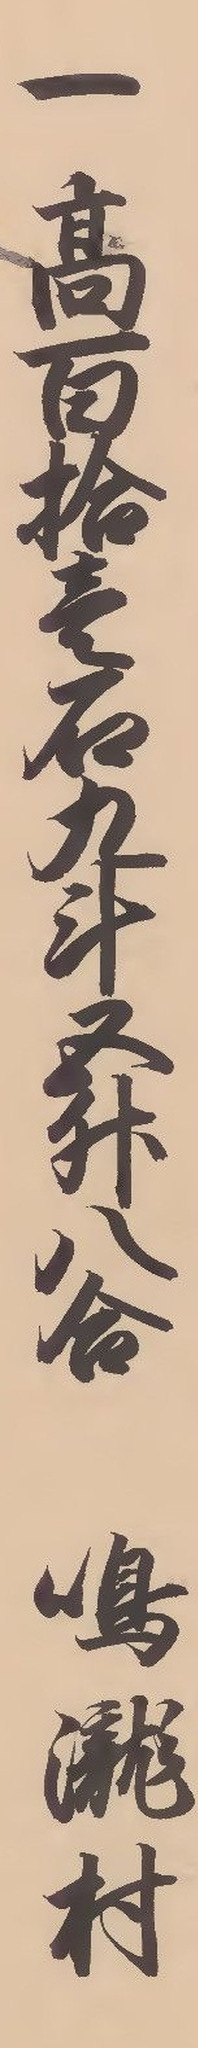一高百拾壱石九斗五升八合鳴滝村

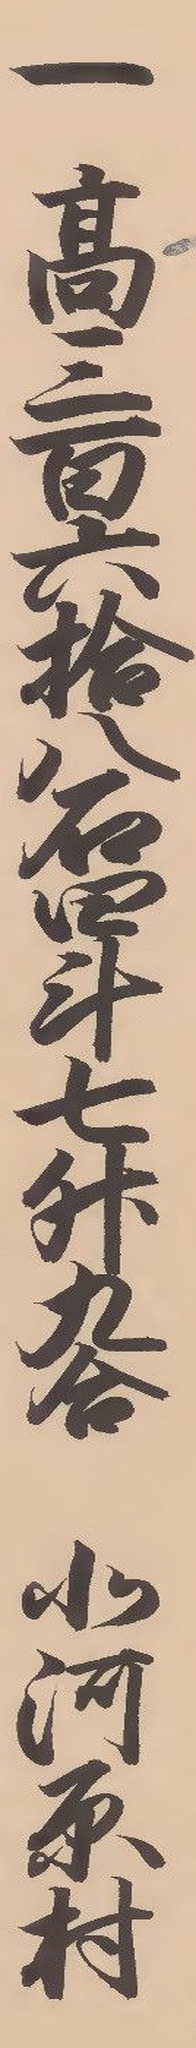一高三百六拾八石四斗七升九合北河原村
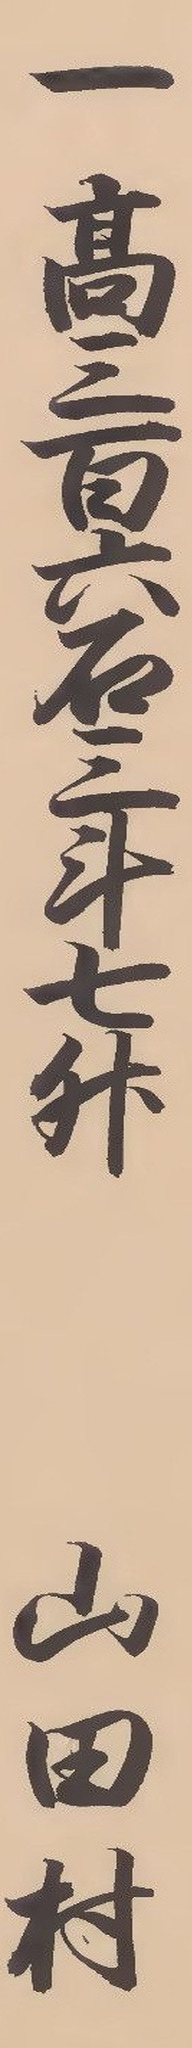一高三百六石三斗七升山田村
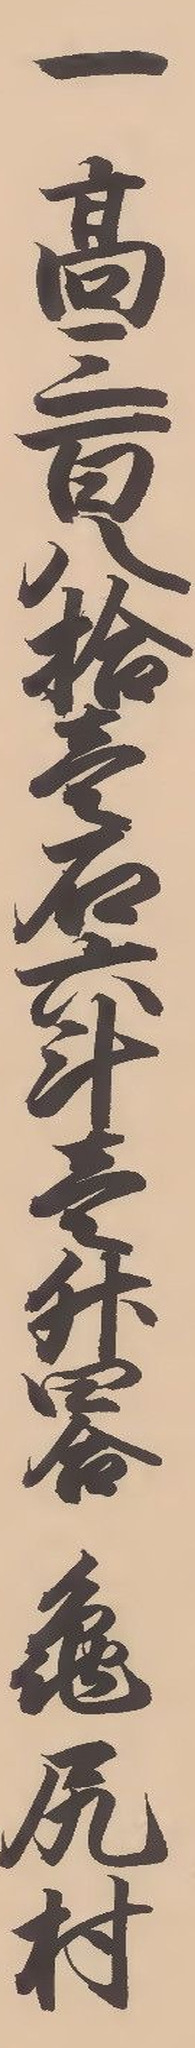一高三百八拾壱石六斗壱升四合亀尻村
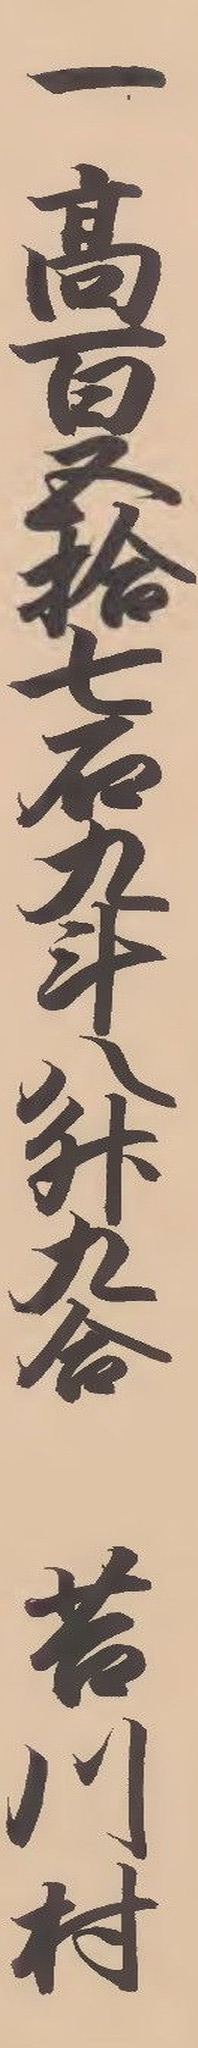一高百五拾七石九斗八升九合芳川村
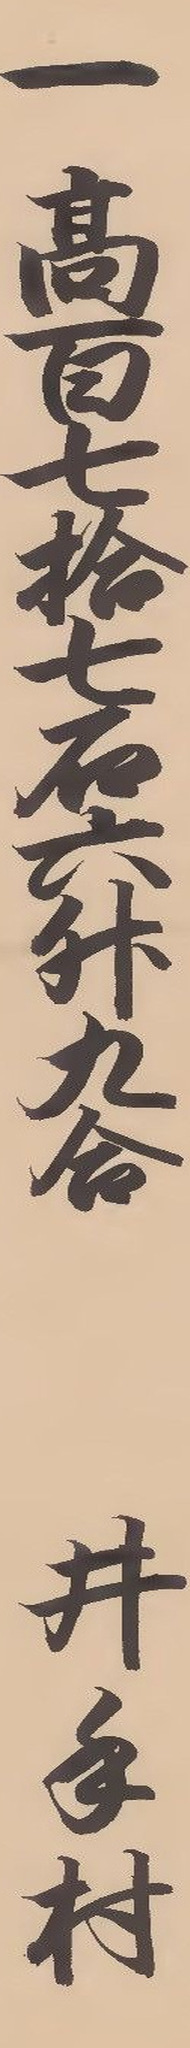一高百七拾七石六升九合井手村
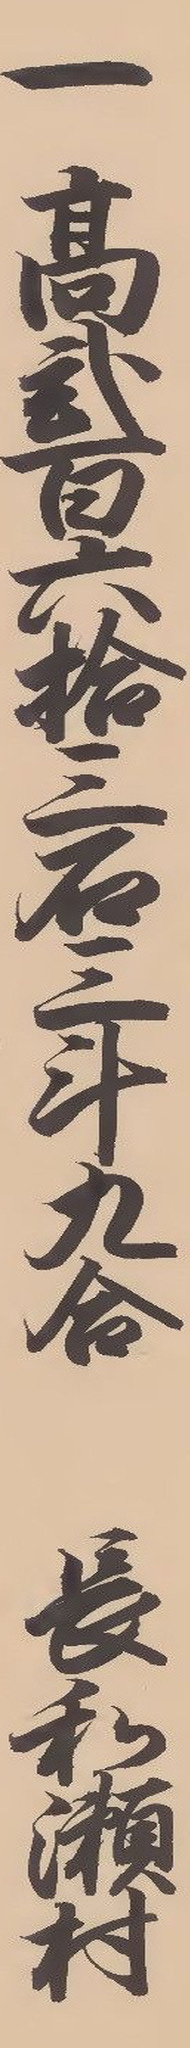一高弐百六拾三石三斗九合長和瀬村
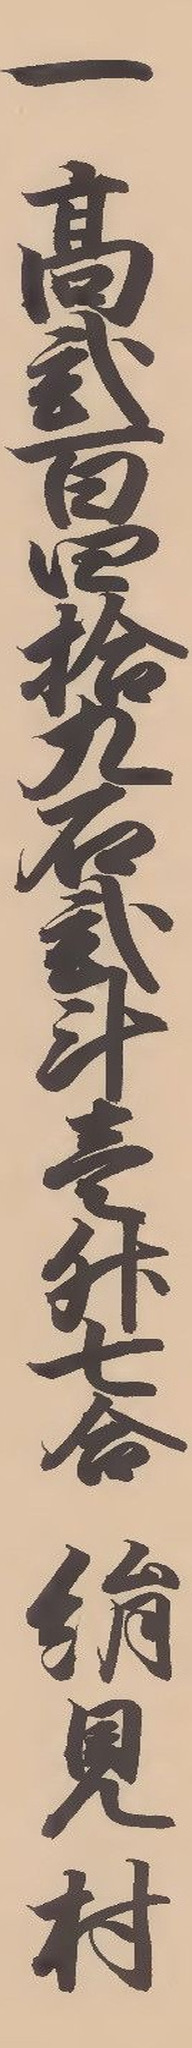一高弐百四拾九石弐斗壱升七合絹見村
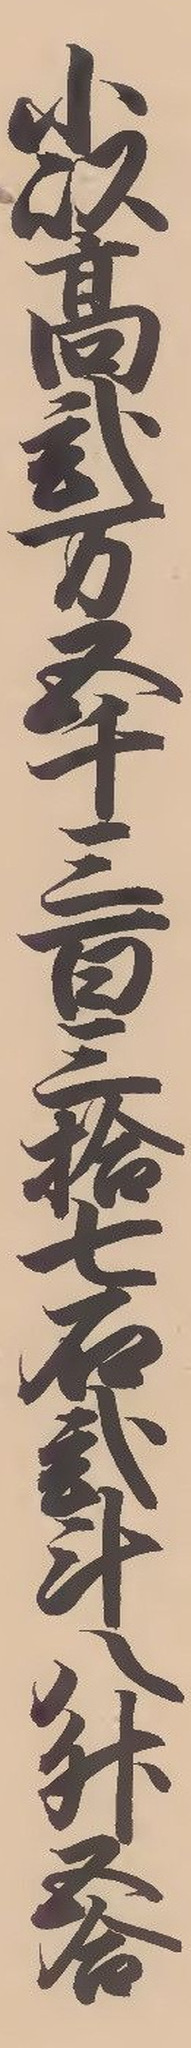小以高弐万五千三百三拾七石弐斗八升五合

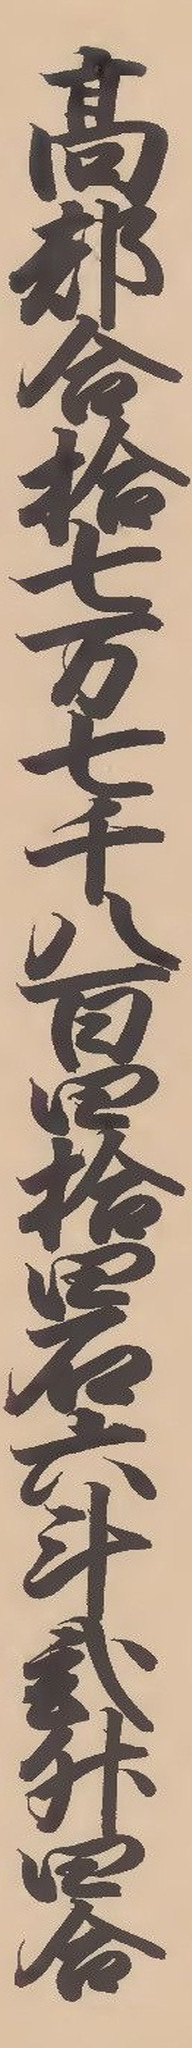高都合拾七万七千八百四拾四石六斗弐升四合
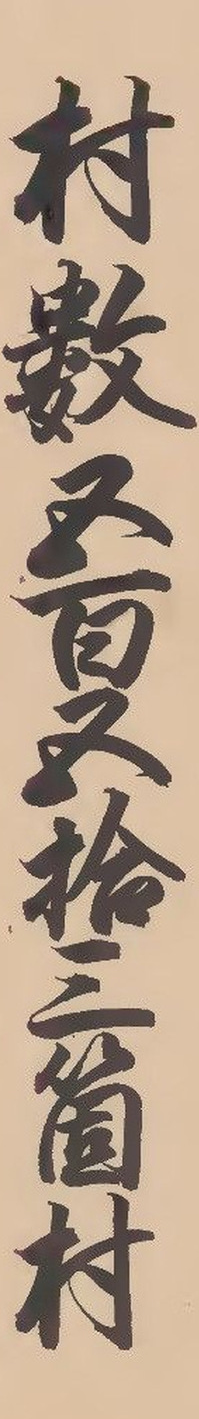村数五百五拾三箇村
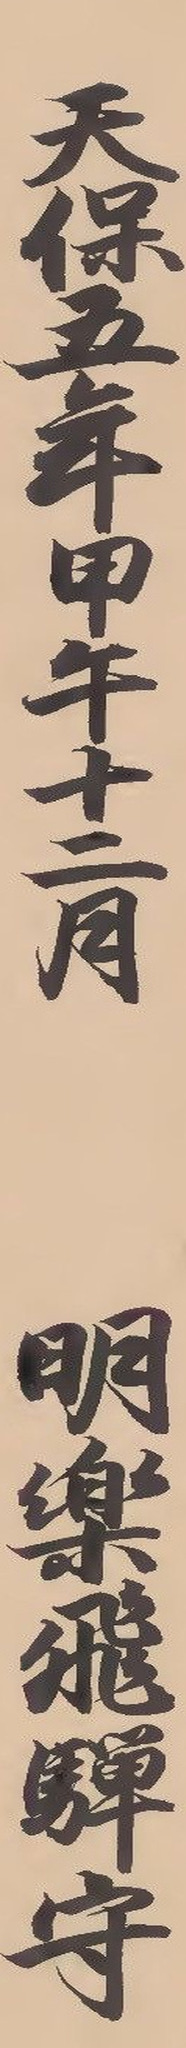天保五年甲午十二月明楽飛騨守
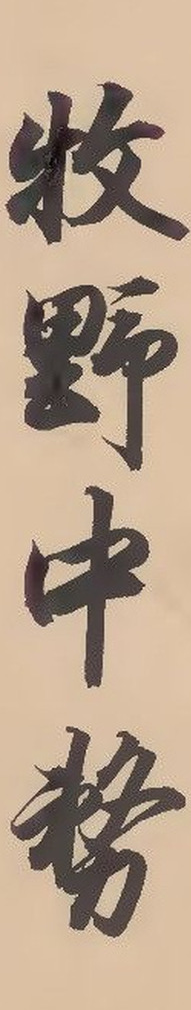牧野中務
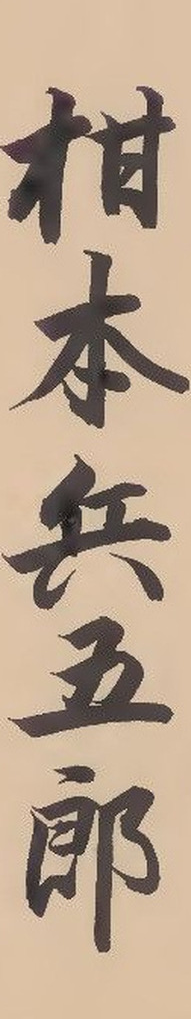柑本兵五郎
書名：因幡国郷帳
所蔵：国立公文書館 National Archives of Japan
